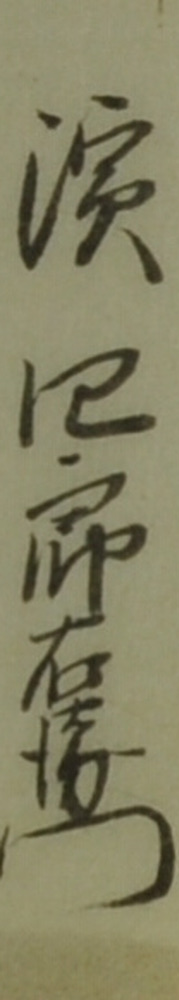濱四郎右衛門
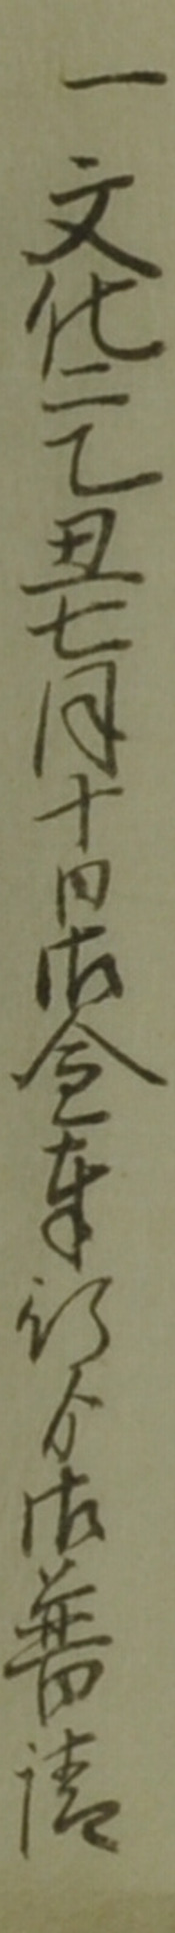一文化二乙丑七月十日御金奉行ゟ御普請
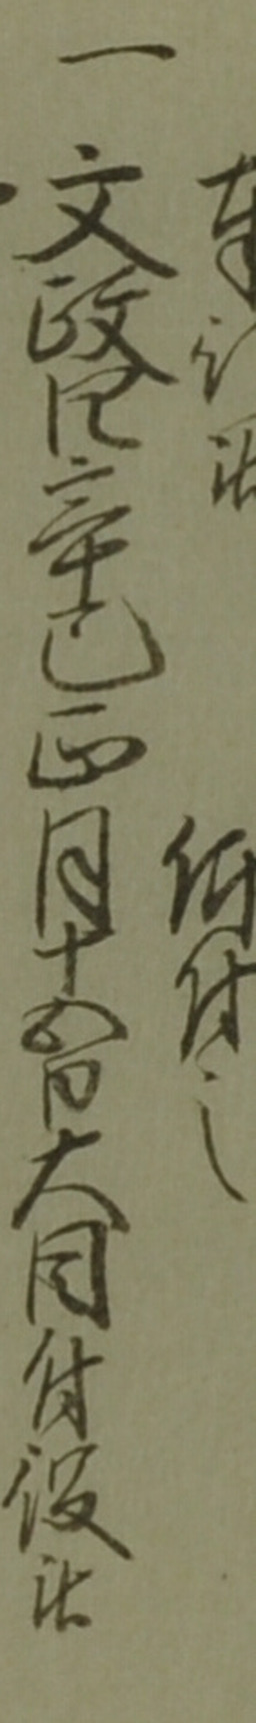一文政四辛巳正月十五日大目付役被
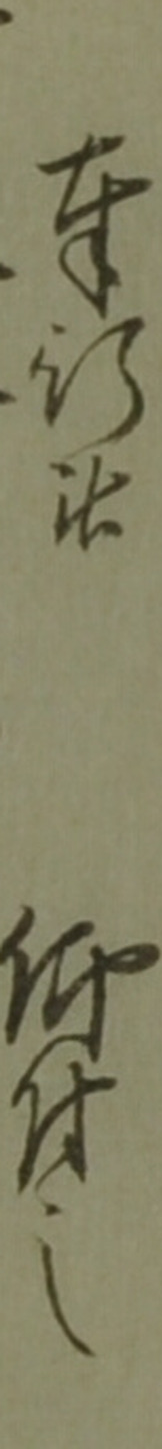奉行被仰付之
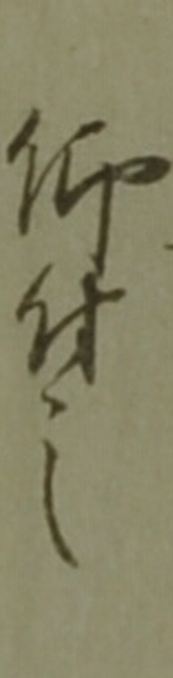仰付之
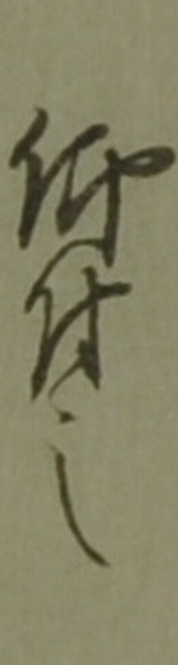仰付之
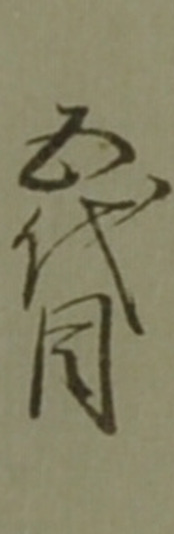五代目
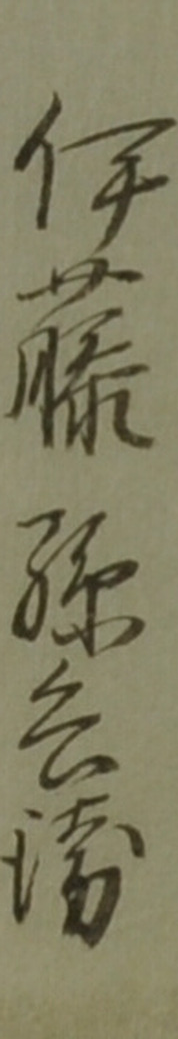伊藤孫兵衛
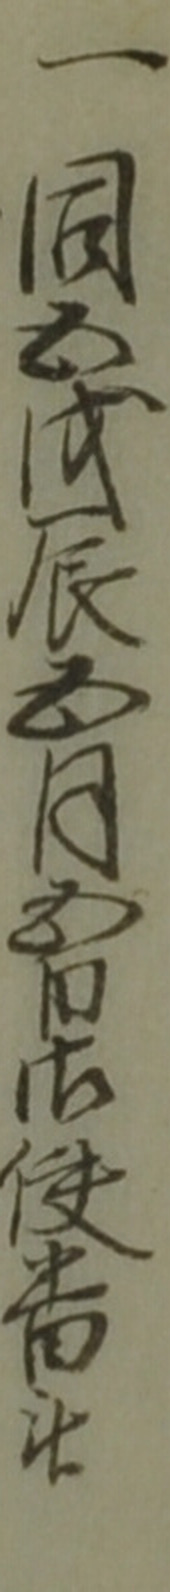一同五戊辰五月五日御使番被
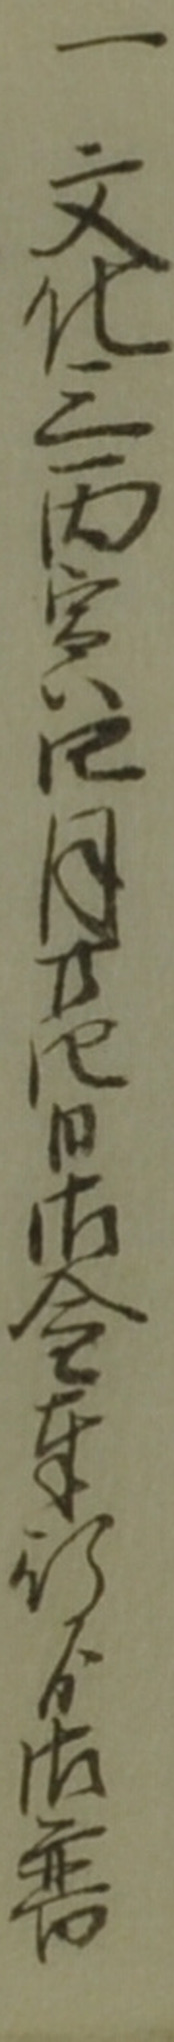一文化三丙寅四月廿四日御金奉行ゟ御普
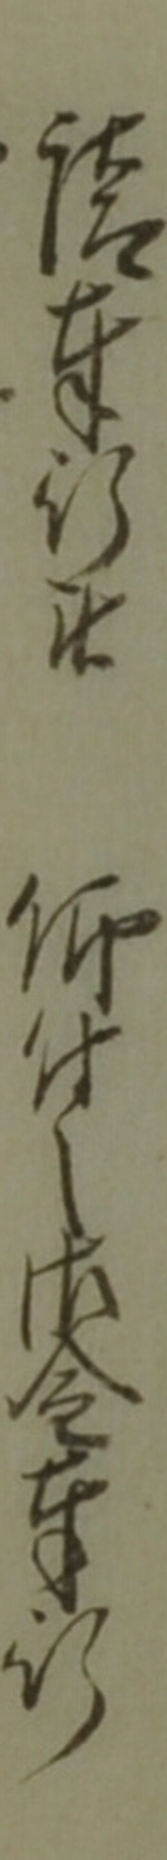請奉行被仰付之御金奉行
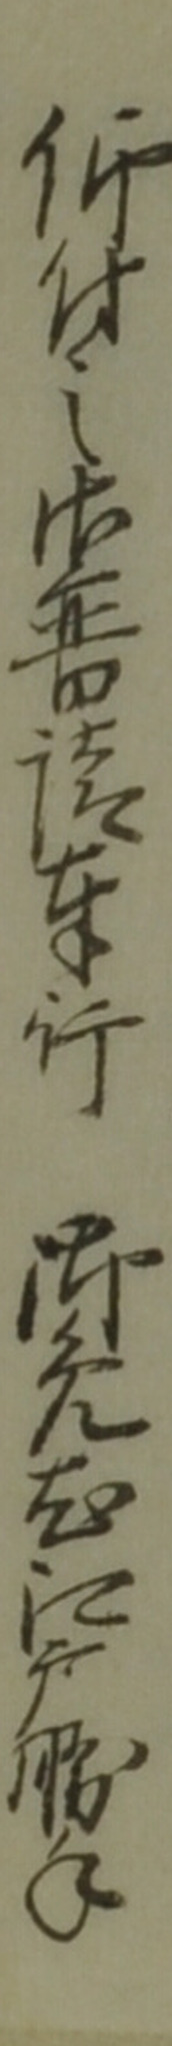仰付之御普請奉行御免尤江戸勝手
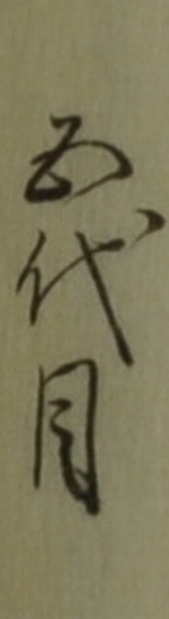五代目
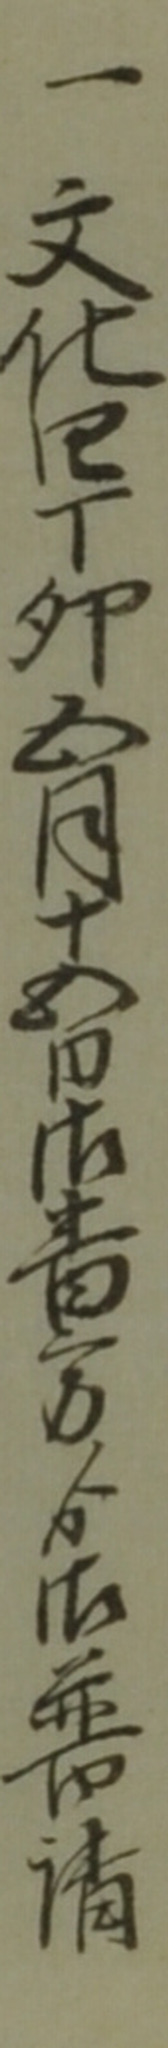一文化四丁卯五月十五日御番方ゟ御普請
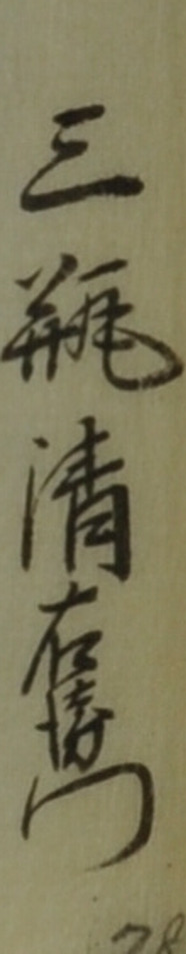三瓶清右衛門
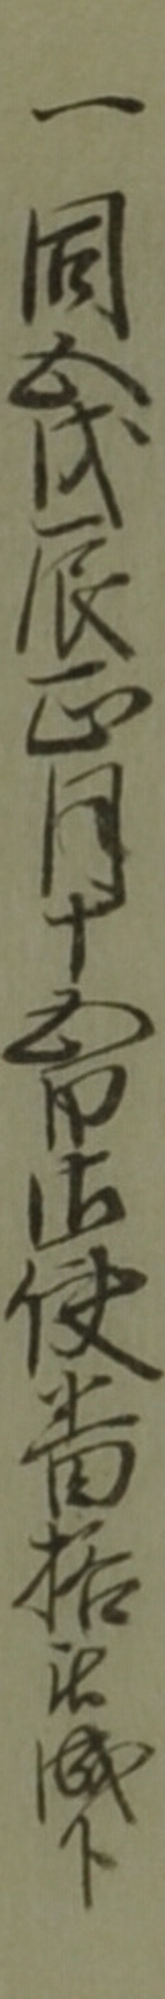一同五戊辰正月十五日御使番格被成下
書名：諸御役代々録（六）
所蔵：伊那市立高遠町図書館・合同会社AMANE
